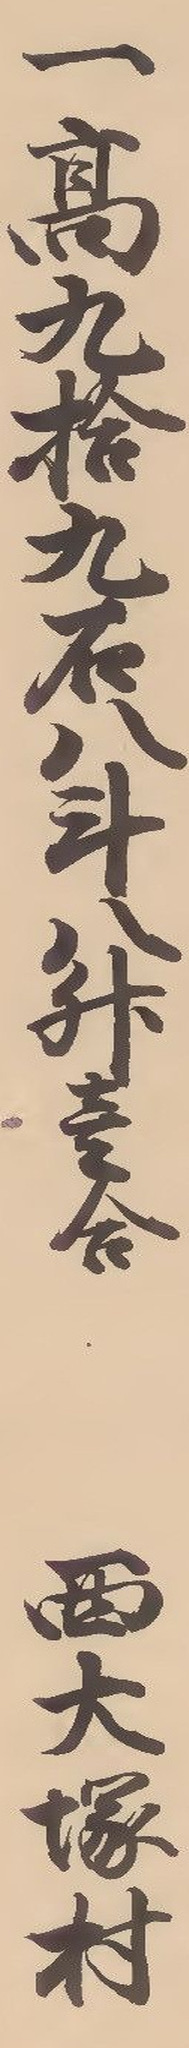一高九拾九石八斗八升壱合西大塚村

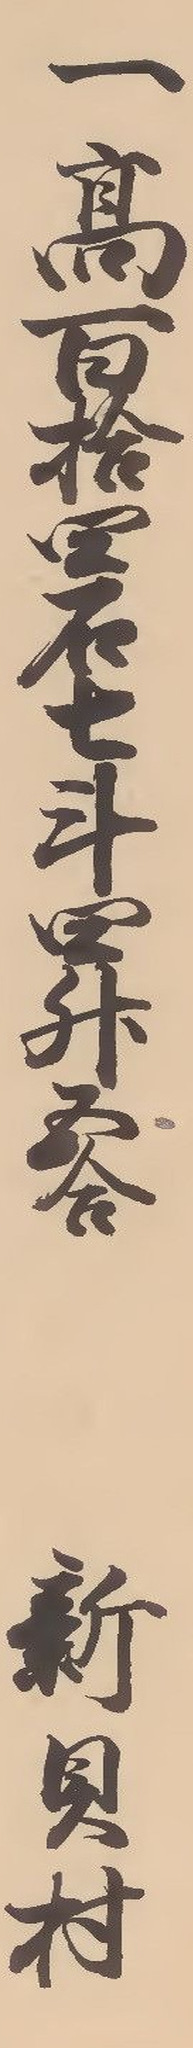一高百拾四石七斗四升五合新貝村
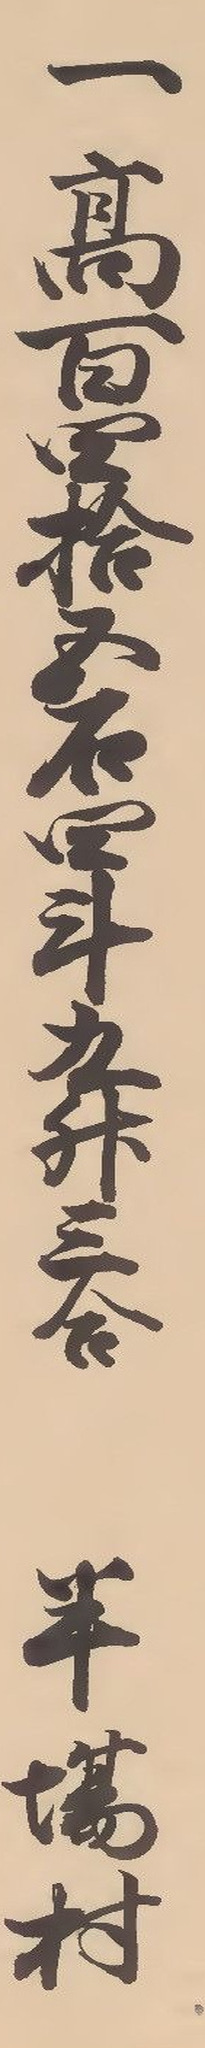一高百四拾五石四斗九升三合半場村
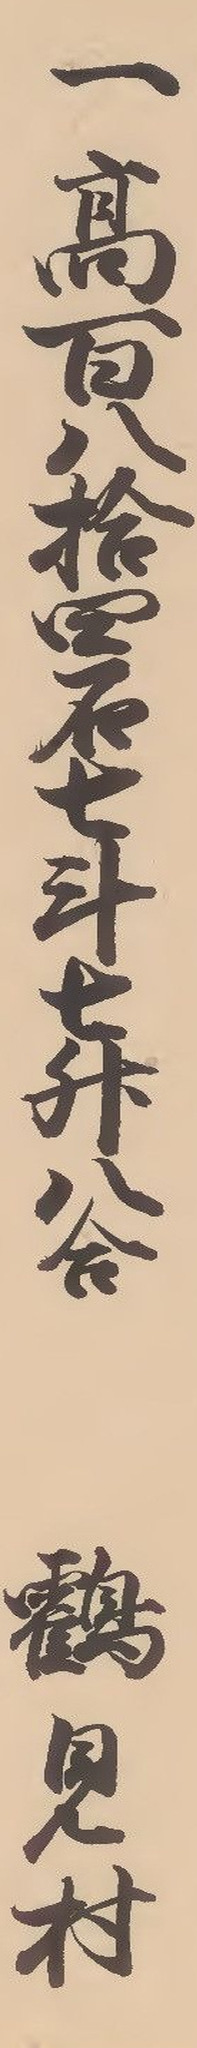一高百八拾四石七斗七升八合鶴見村
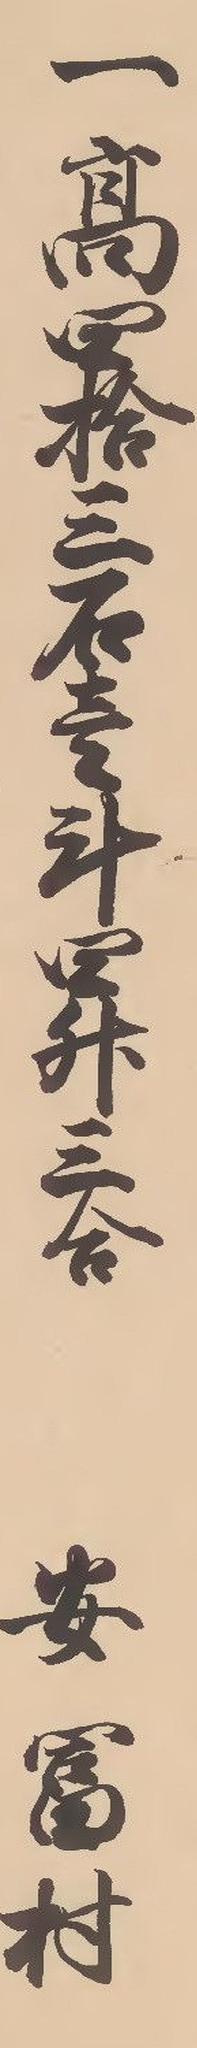一高四拾三石壱斗四升三合安富村
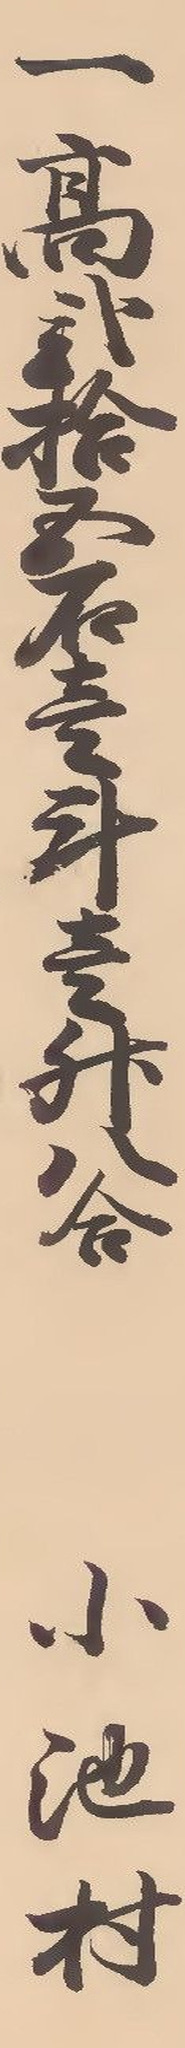一高弐拾五石壱斗壱升八合小池村
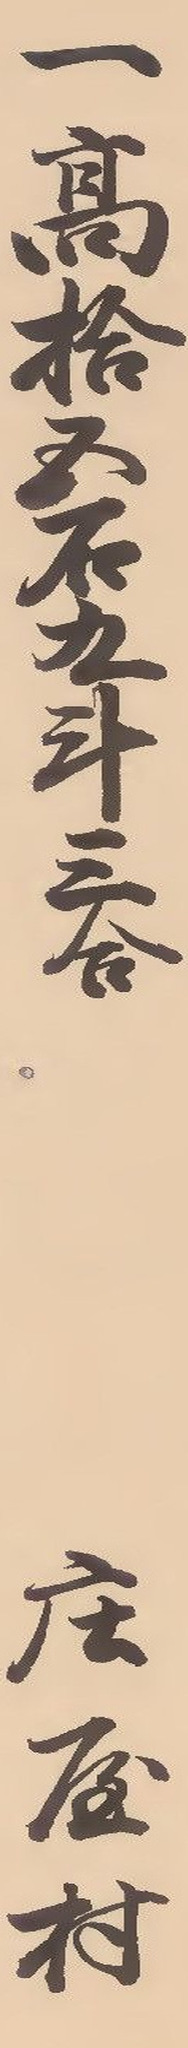一高拾五石九斗三合庄屋村
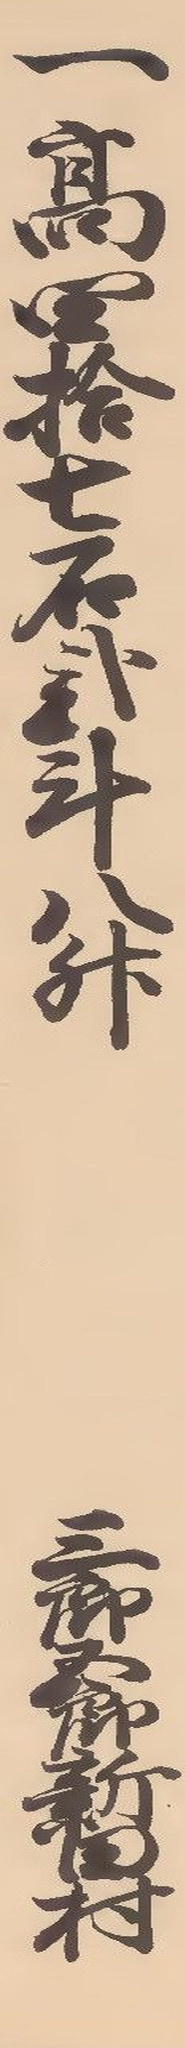一高四拾七石弐斗八升三郎五郎新田村
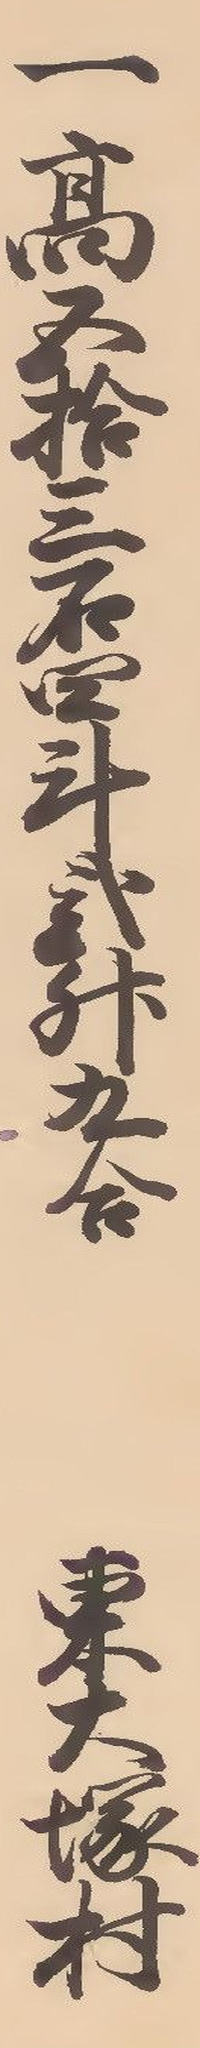一高五拾三石四斗弐升九合東大塚村

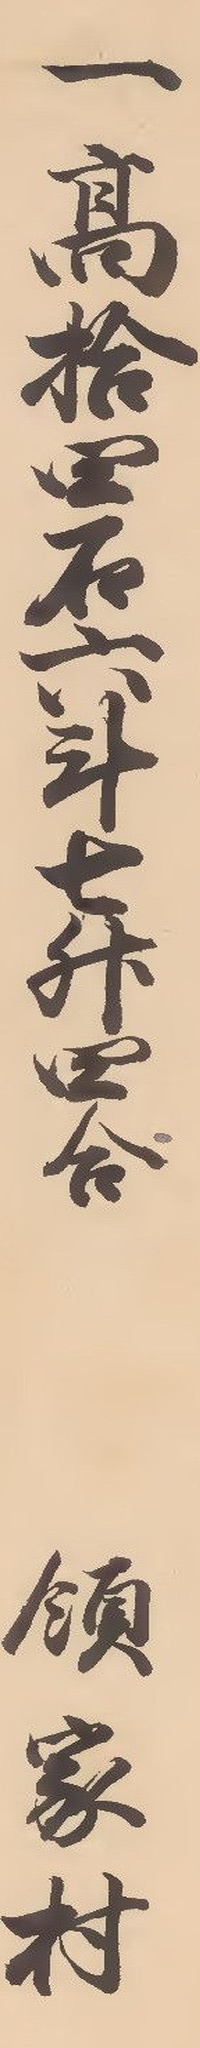一高拾四石六斗七升四合領家村
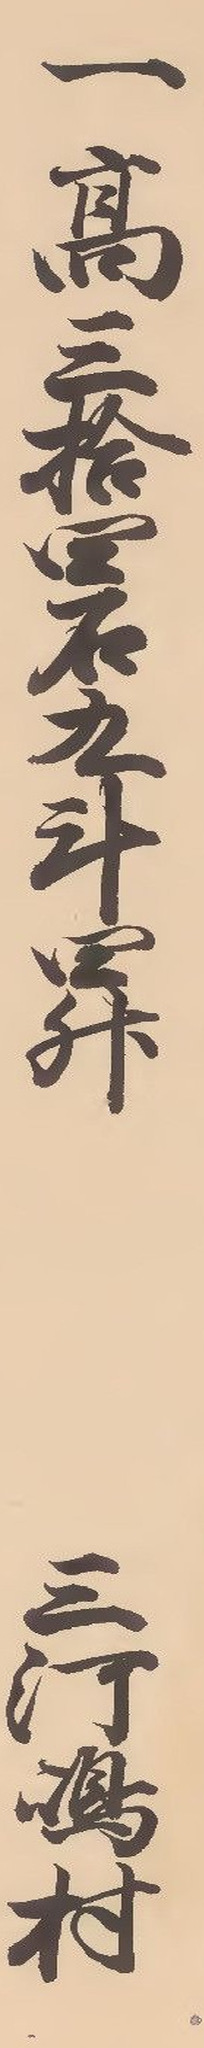一高三拾四石九斗四升三河島村
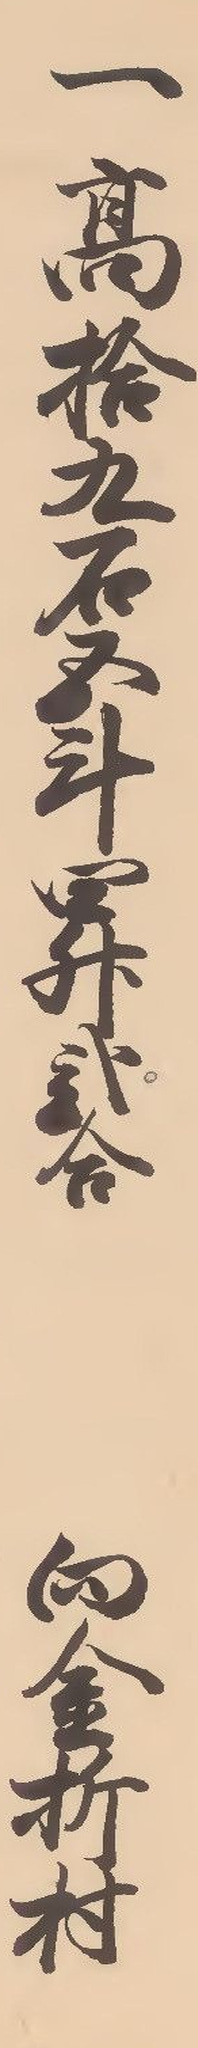一高拾九石五斗四升弐合向金折村
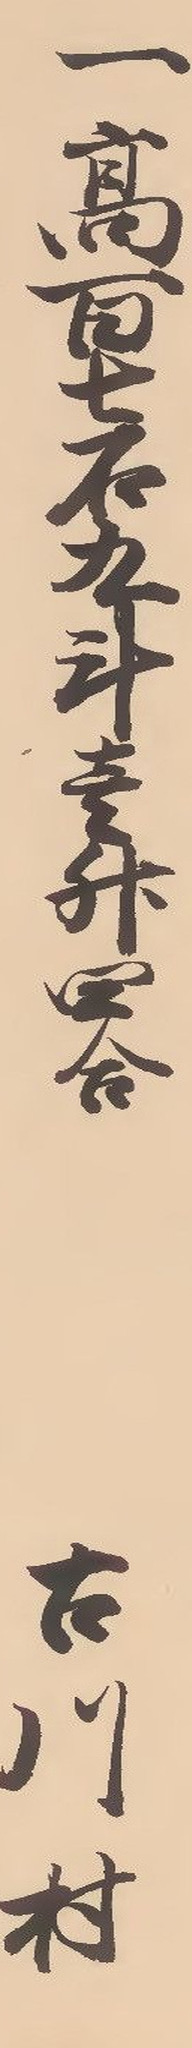一高百七石九斗壱升四合古川村
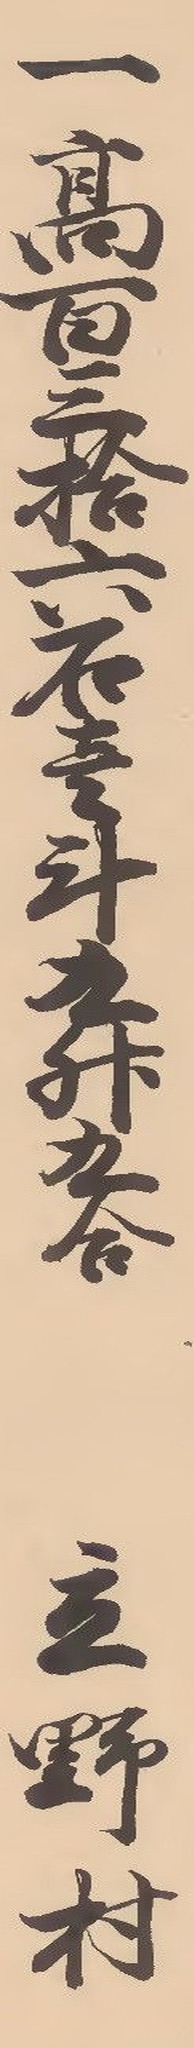一高百三拾六石壱斗九升九合立野村
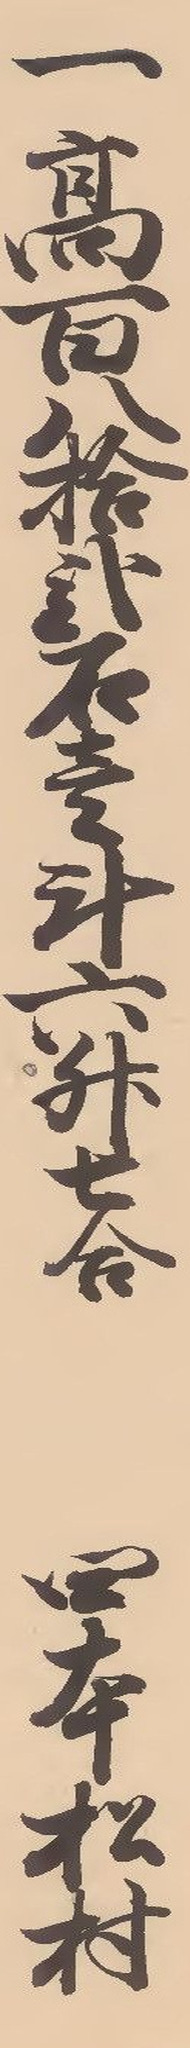一高百八拾弐石壱斗六升七合四本松村
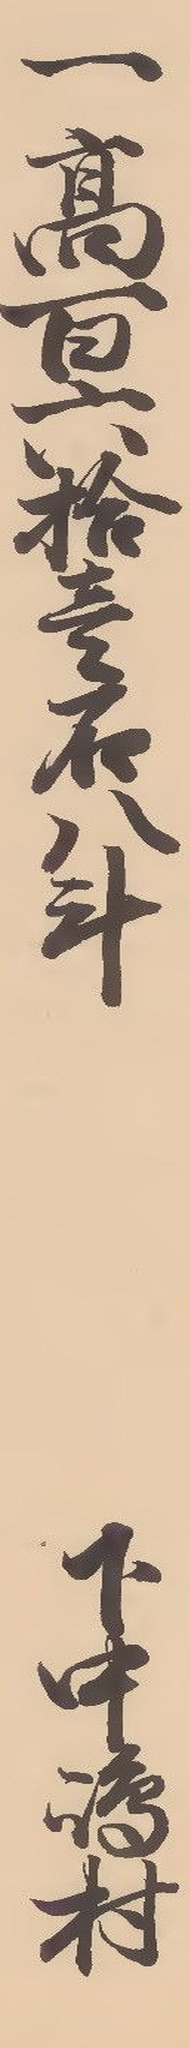一高百六拾壱石八斗下中島村
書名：遠江国郷帳
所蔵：国立公文書館 National Archives of Japan
